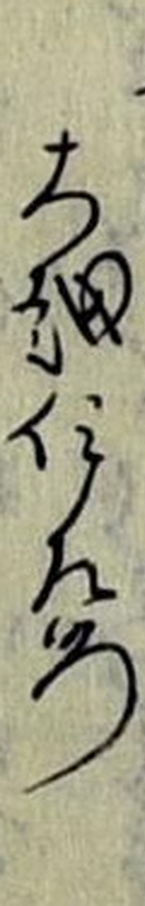大越伊左衛門
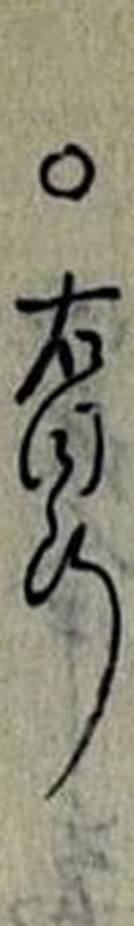〇右同断
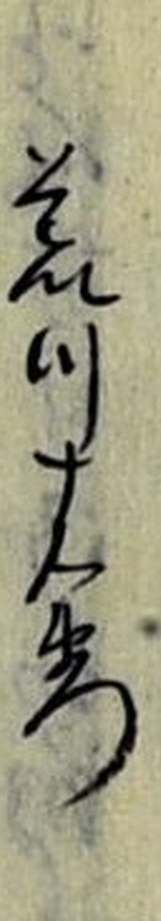荒川十右衛門
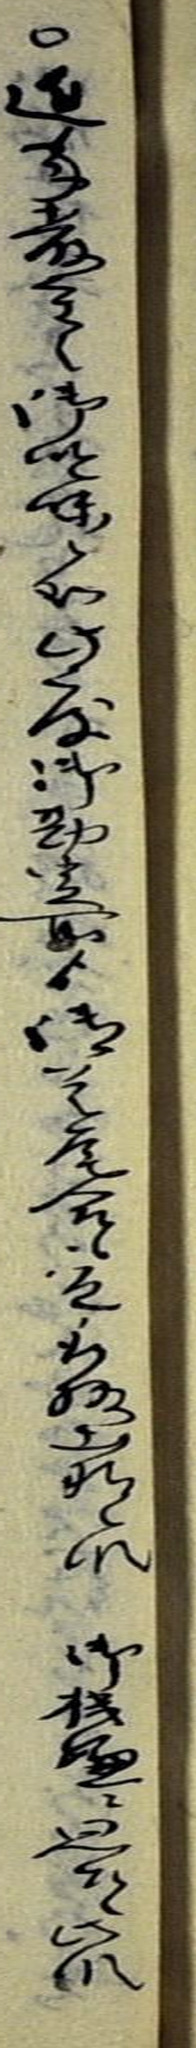〇近年厳重之御吟味候処此度御勘定所ゟ御首尾合も宜取扱出精之段御機嫌ニ思召候此段
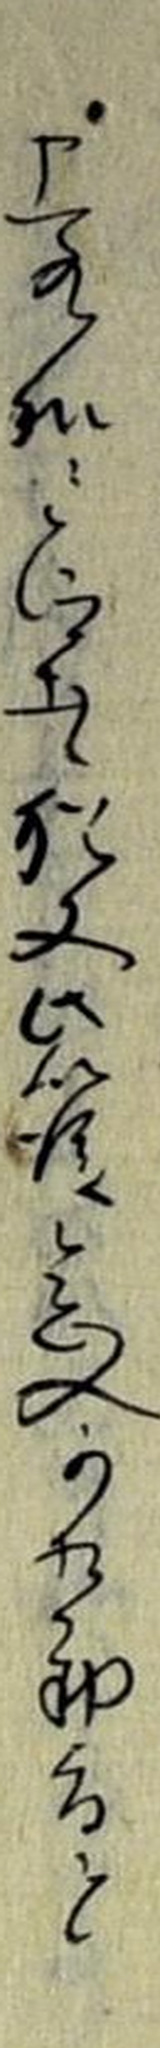申聞候様ニ被仰出候猶又此以後念入可相勤旨ニ候
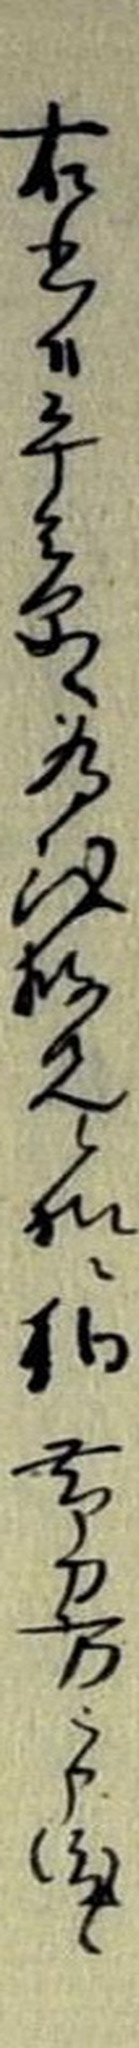右書付平兵衛へ為致披見候様ニ狛帯刀方被申渡候
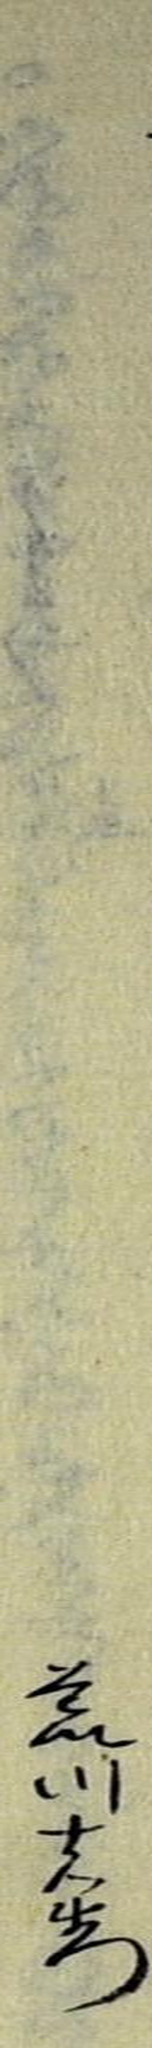荒川十右衛門
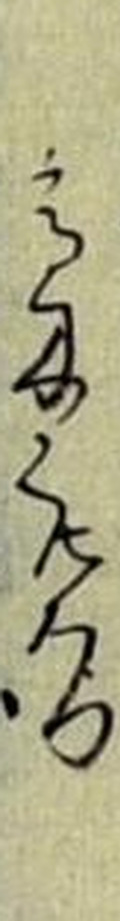高木庄右衛門
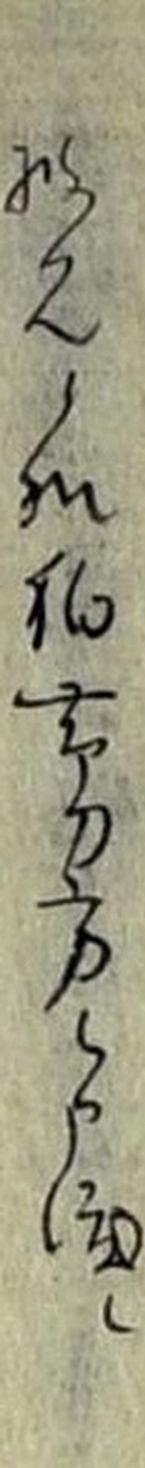披見候様狛帯刀方被申渡候
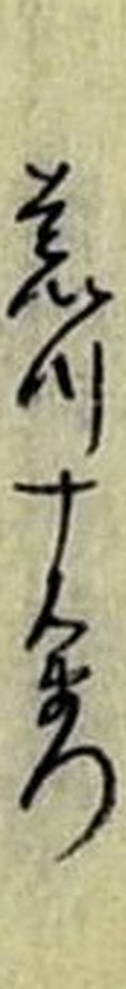荒川十右衛門
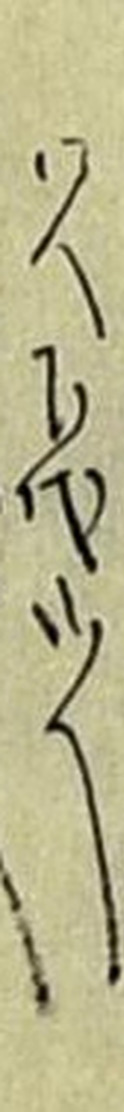同人下代弐人
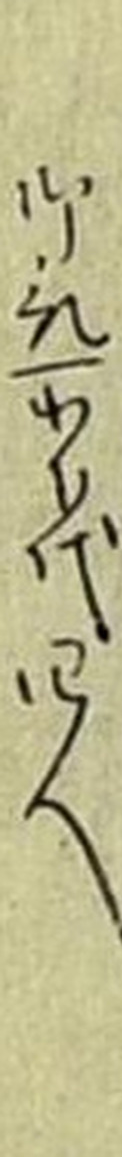御預所下代四人
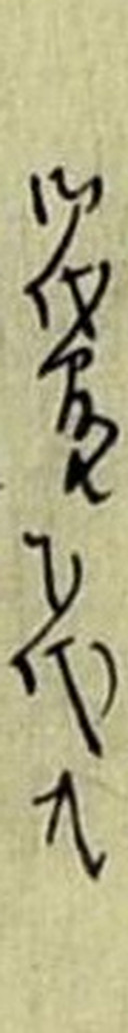御代官共下代共
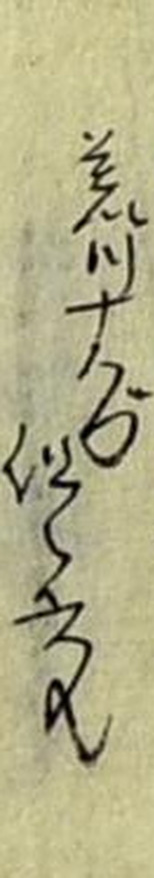荒川十右衛門
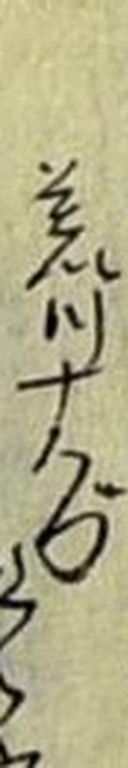荒川十右衛門
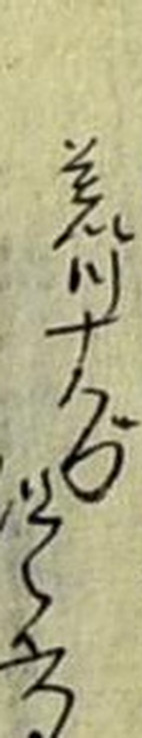荒川十右衛門
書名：命令之部 一
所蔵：福井県文書館 Fukui Prefectural Archives
